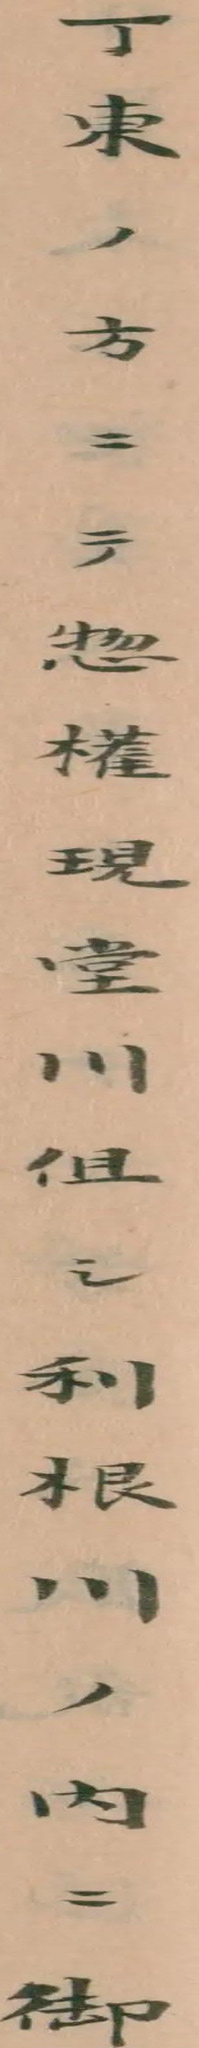丁東ノ方ニテ惣権現堂川但シ利根川ノ内二御
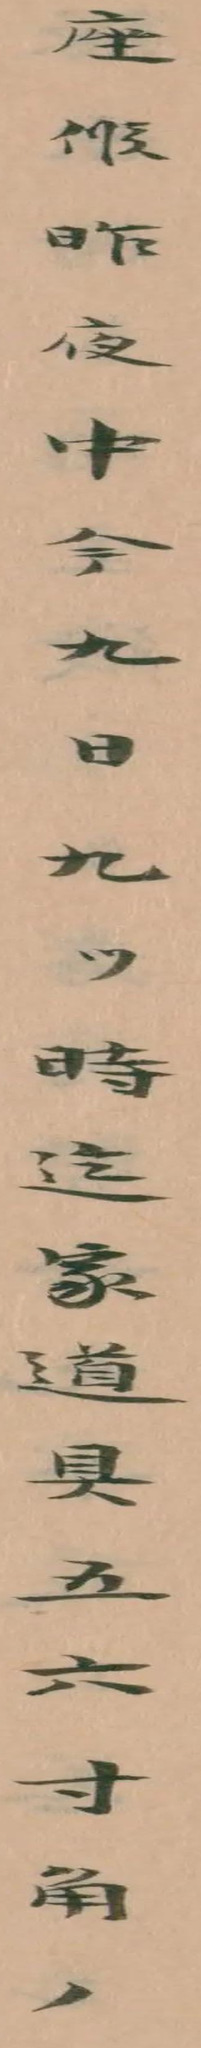座候昨夜中今九日九ッ時迄家道具五六寸角ノ
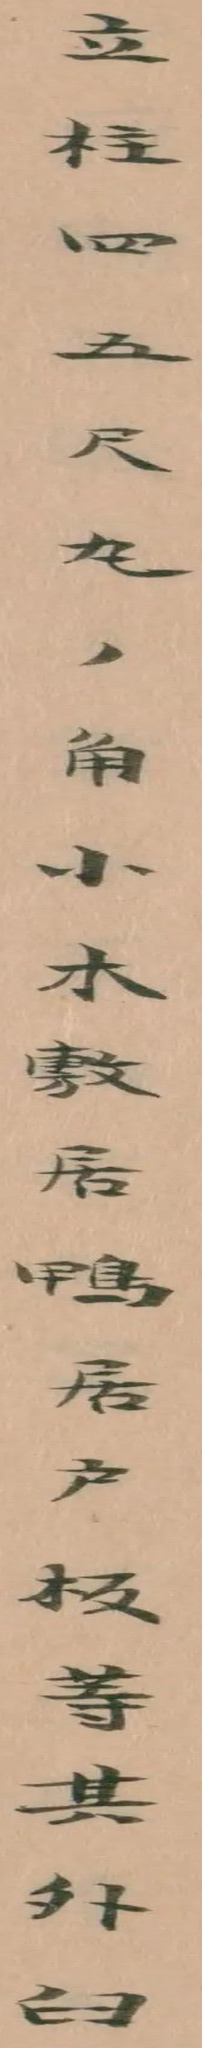立柱四五尺丸ノ角小木敷居鴨居戸板等其外臼
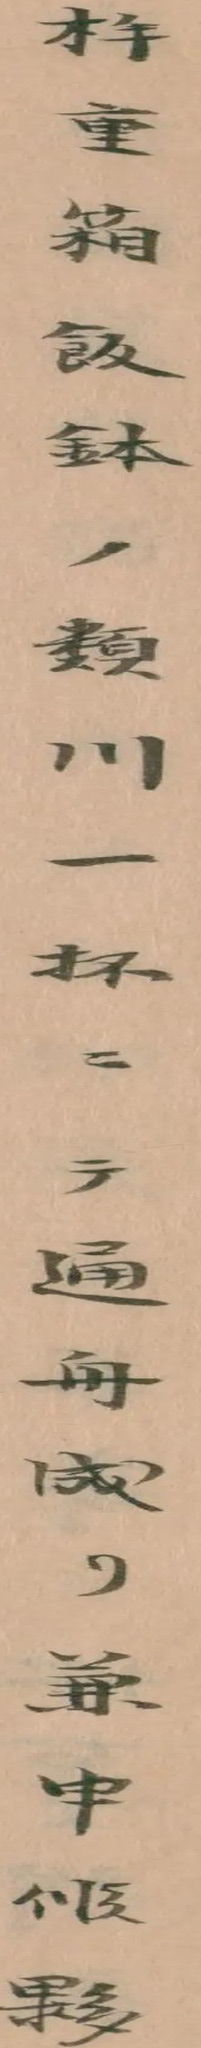杵重箱飯鉢ノ類川一杯ニテ通舟成り兼申候夥
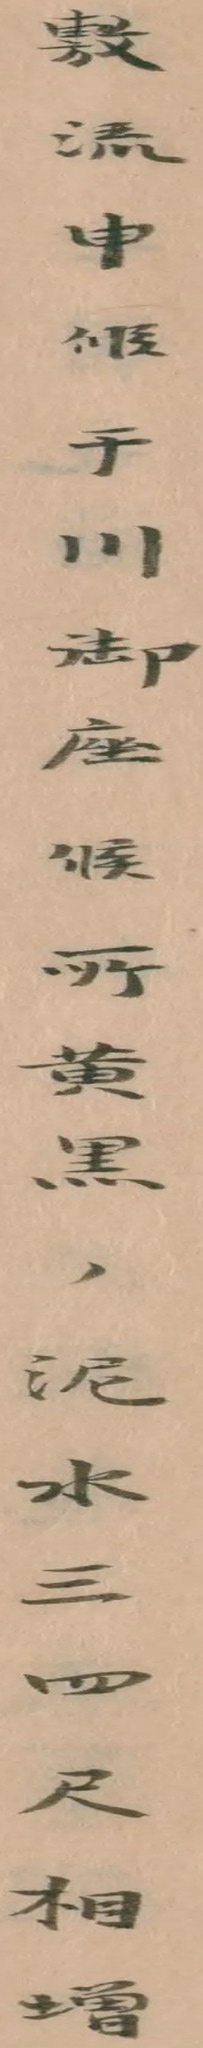敷流申候干川御座候所黄黒ノ泥水三四尺相増
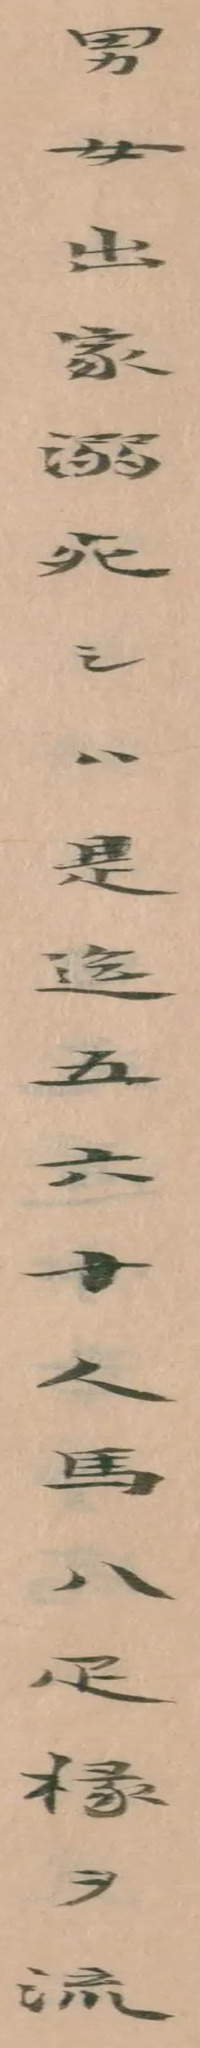男女出家溺死シハ是迄五六拾人馬ハ疋縁ヲ流
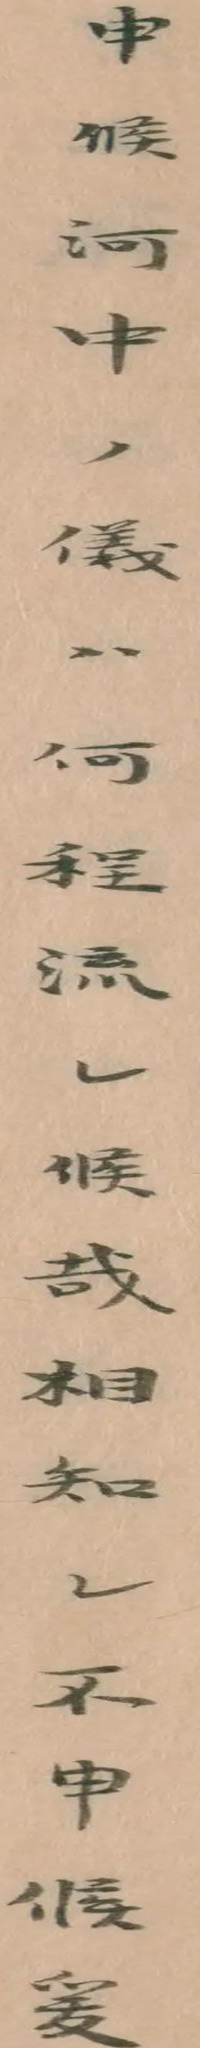申候河中ノ儀ハ何程流レ候哉相知レ不申候爰
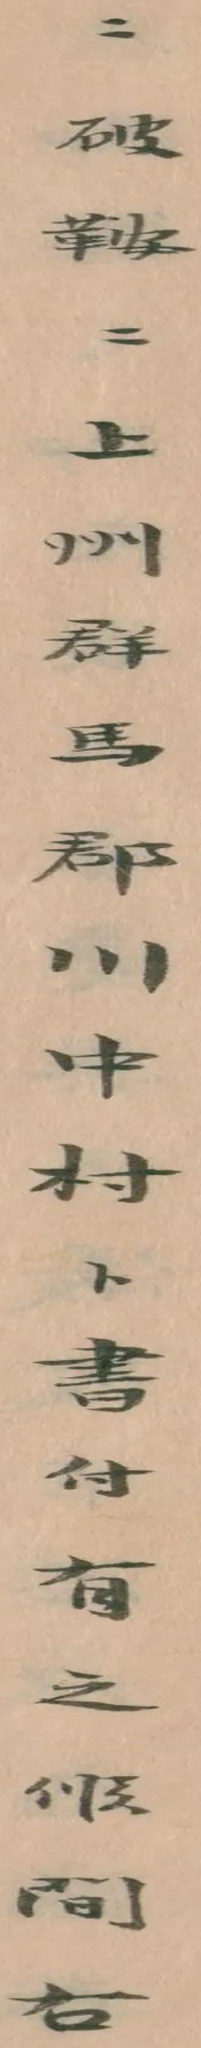二破鞍二上州群馬郡川中村ト書付有之候間右
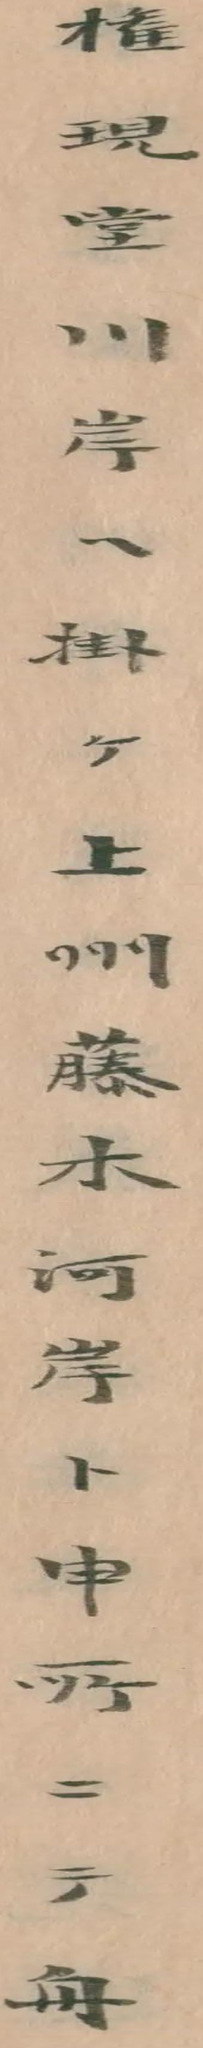権現堂川岸へ掛ヶ上州藤木河岸ト申所ニテ舟
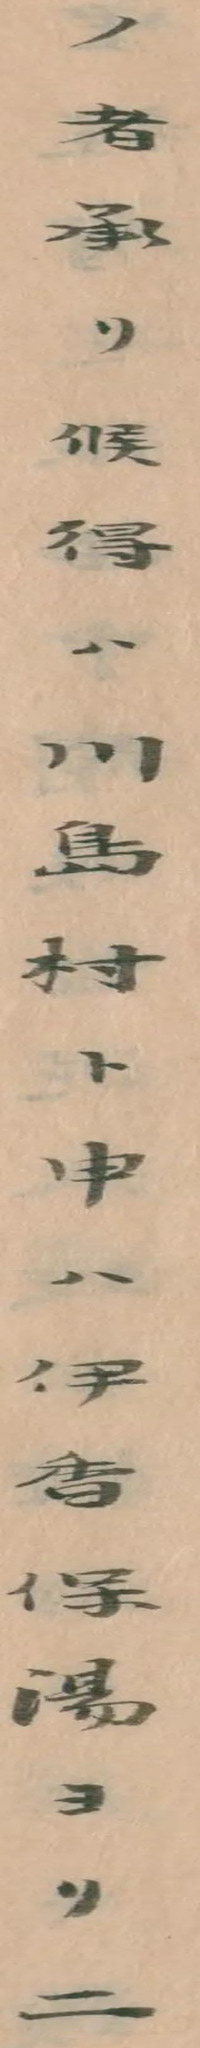ノ者承り候得ハ川島村ト申ハ伊香保湯ヨリ二

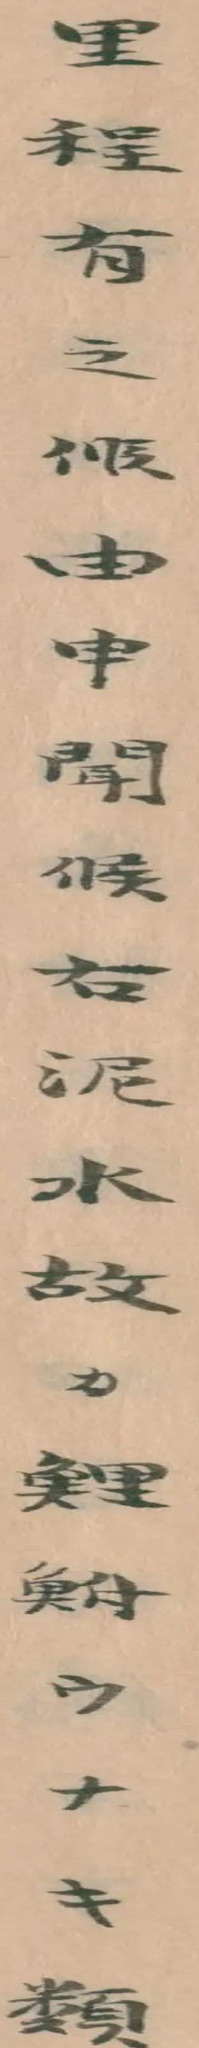里程有之候由申聞候右泥水故カ鯉鮒ウナキ類
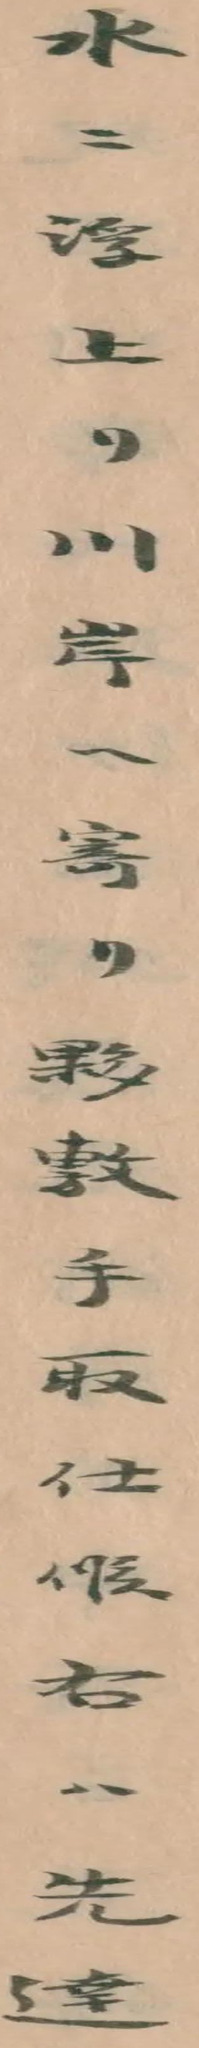水二浮上り川岸へ寄り夥敷手取仕候右ハ先達
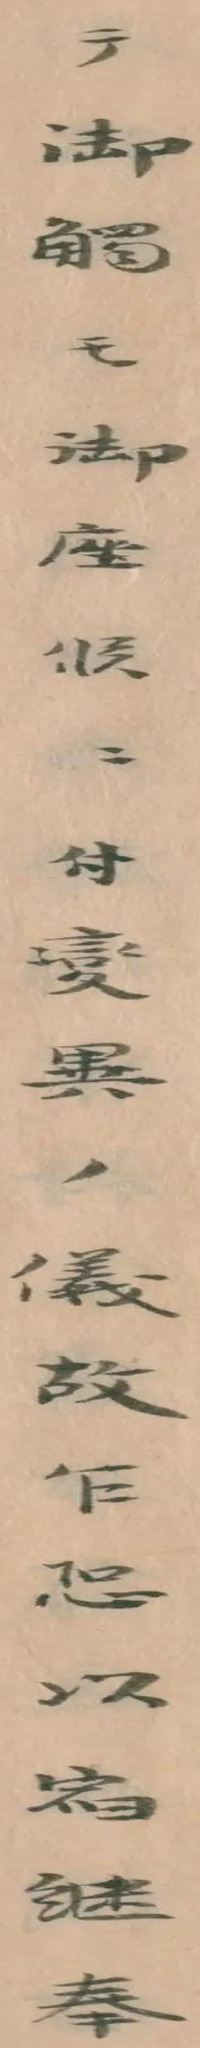テ御触モ御座候二付変異ノ儀故乍恐以宿継奉
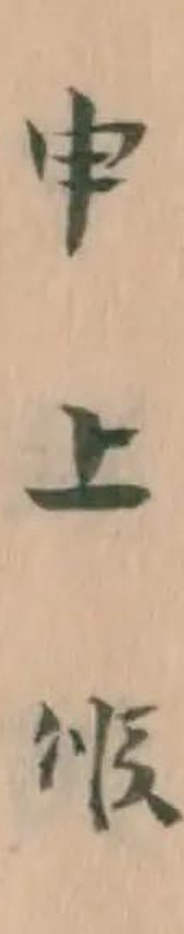申上候
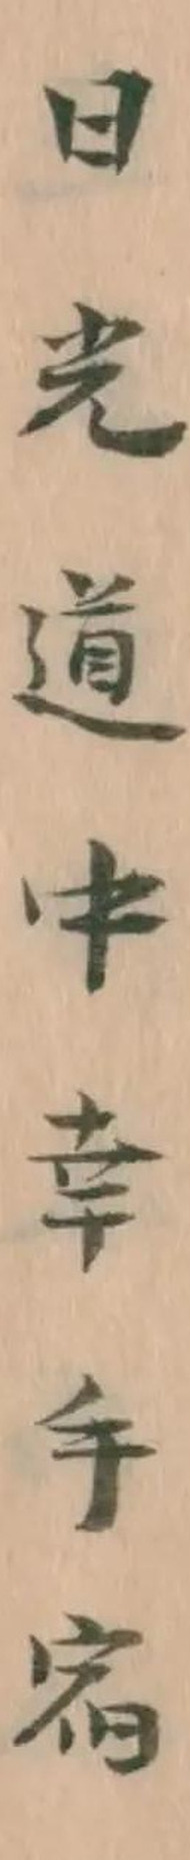日光道中幸手宿
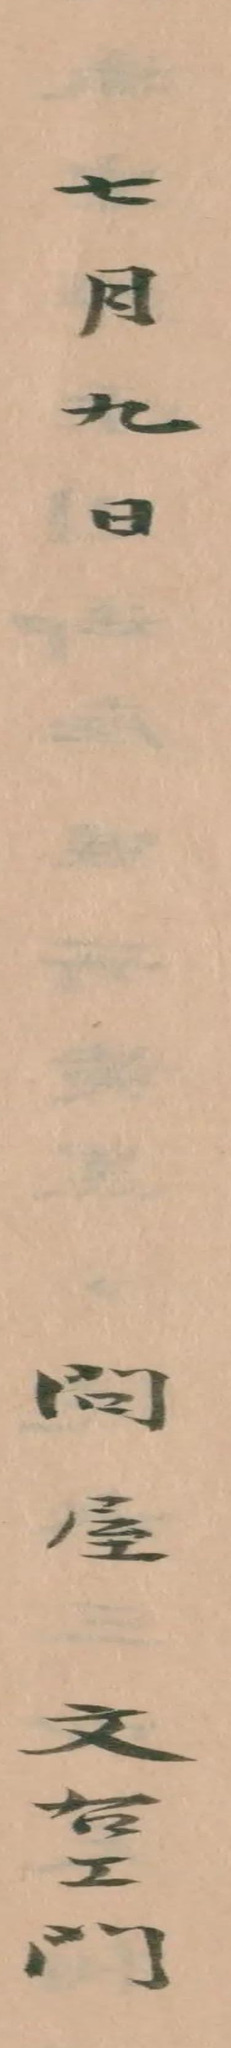七月九日問屋文右エ門
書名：地災撮要. 巻3(地震之部)-巻4(噴火之部)
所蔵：国立国会図書館 National Diet Library, JAPAN
